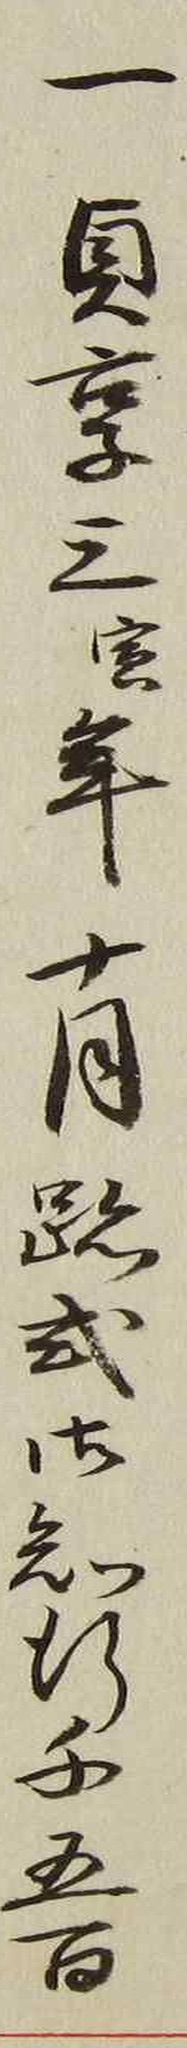一貞享三寅年十月跡式御知行千五百
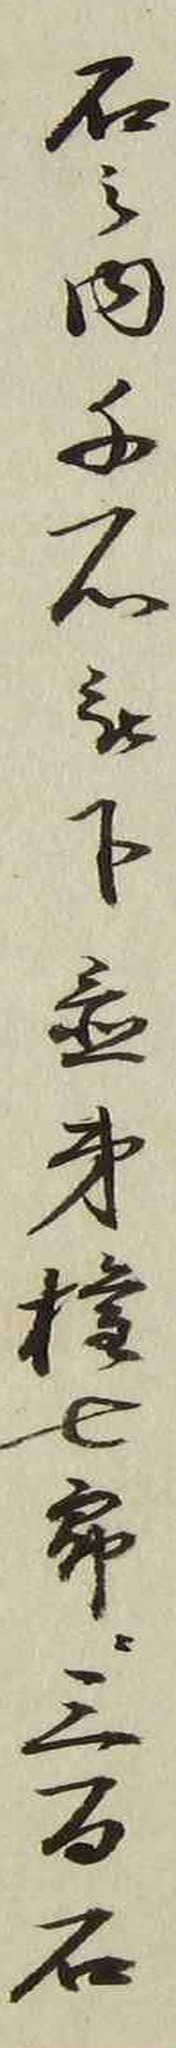石之内千石被下置弟権七郎に三百石
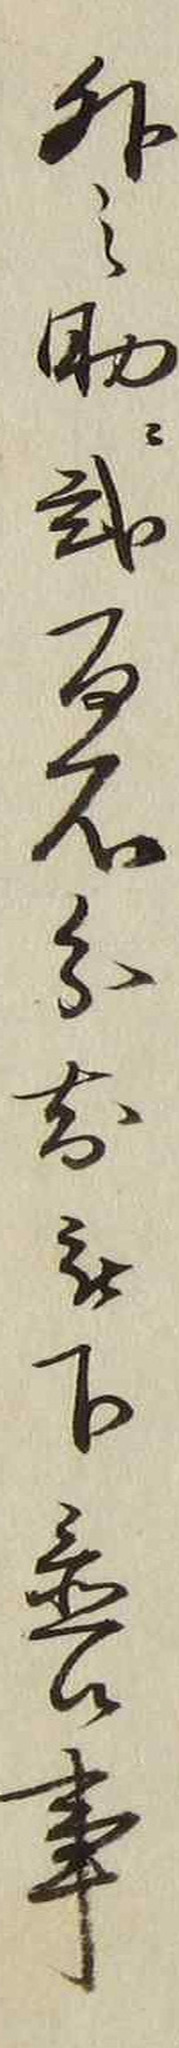外之助に弐百石分知被下置候事
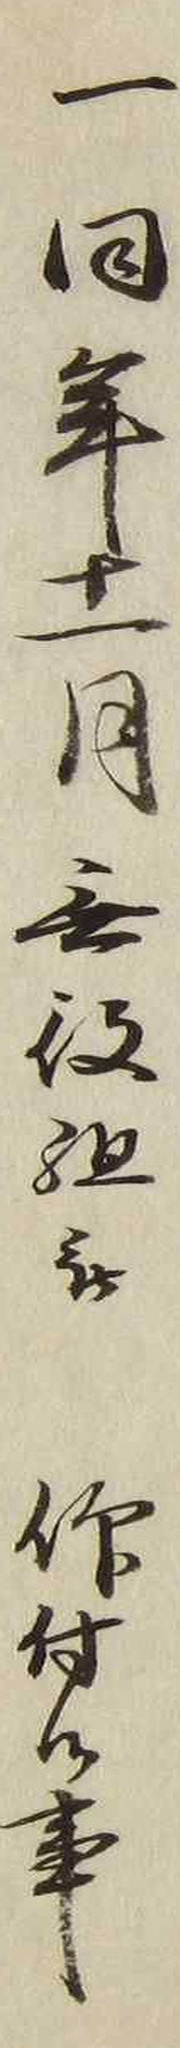一同年十一月無役組被仰付候事
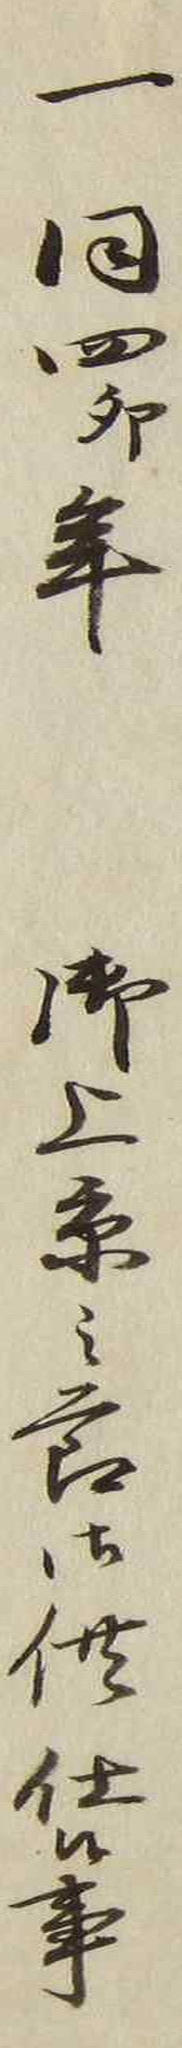一同四卯年御上京之節御供仕候事

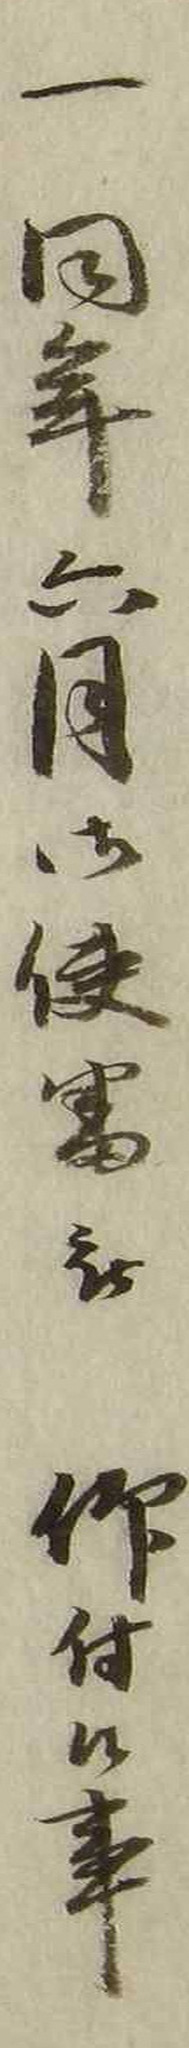一同年六月御使番被仰付候事
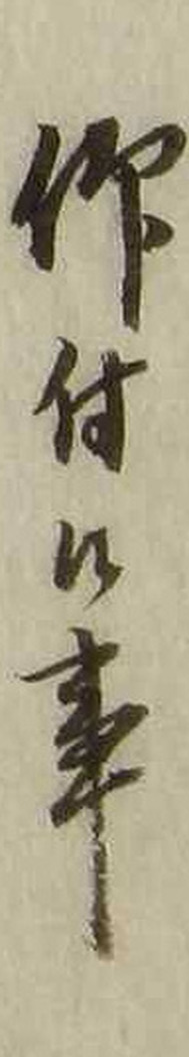仰付候事
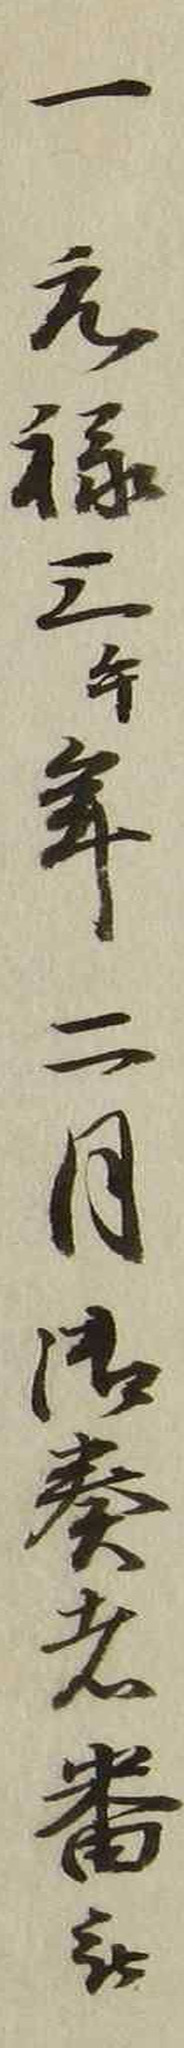一元禄三午年二月御奏者番被
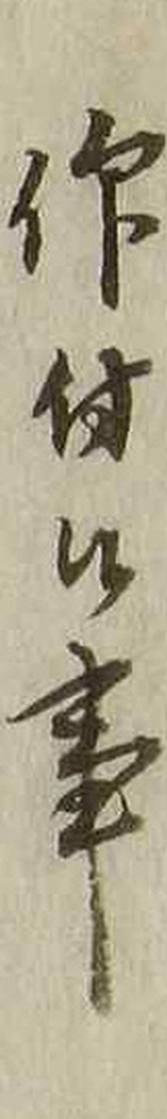仰付候事
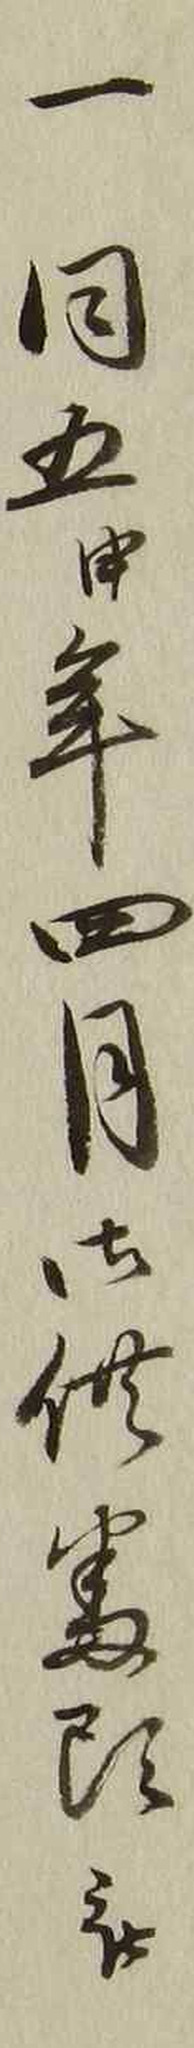一同五申年四月御供番頭被
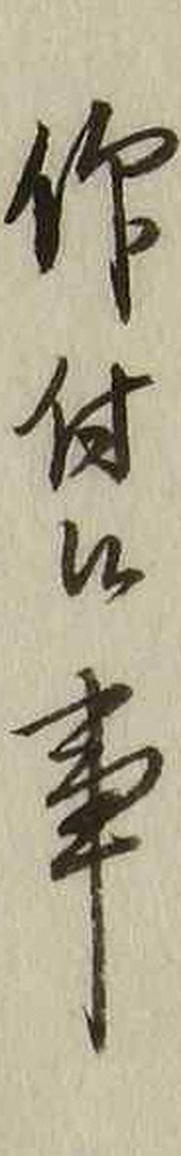仰付候事
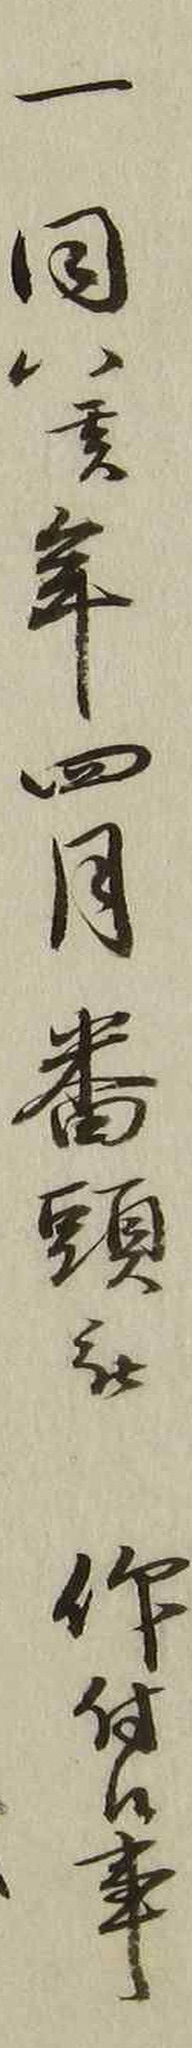一同八亥年四月番頭被仰付候事
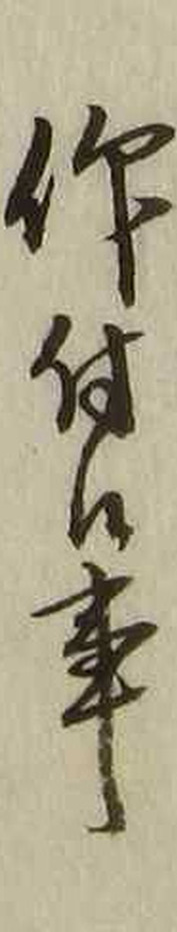仰付候事
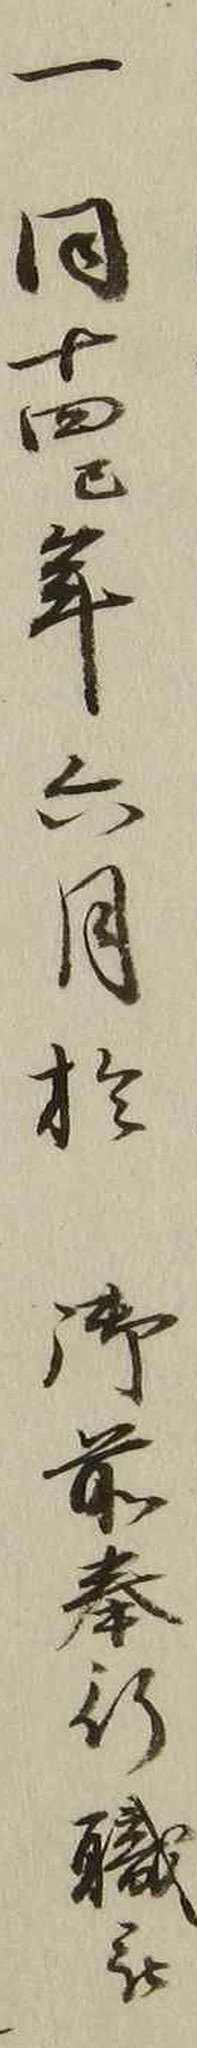一同十四巳年六月於御前奉行職被
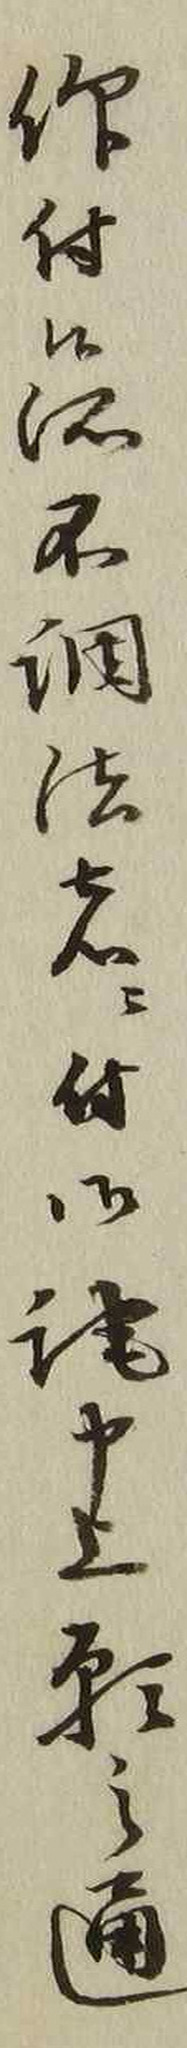仰付候所不調法者に付御詫申上願之通
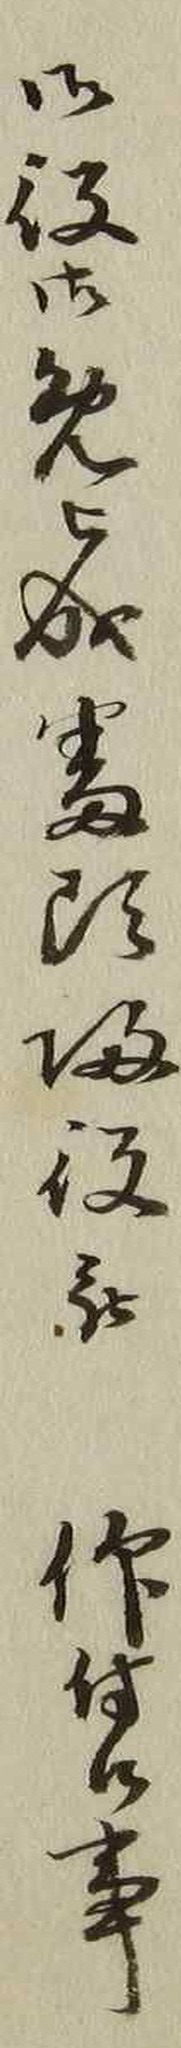御役御免被成番頭帰役被仰付候事
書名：諸士系譜　巻之125　た之部1
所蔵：会津若松市立会津図書館
